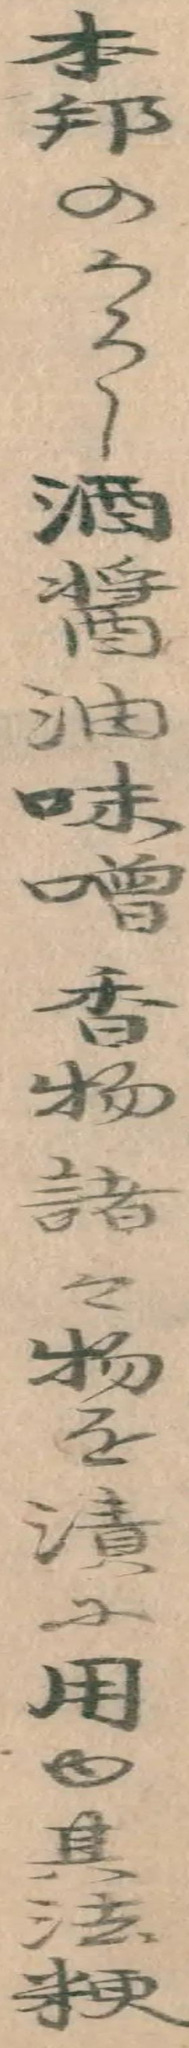本邦のかうし酒醤油味噌香物諸々物を漬に用ゆ其法粳
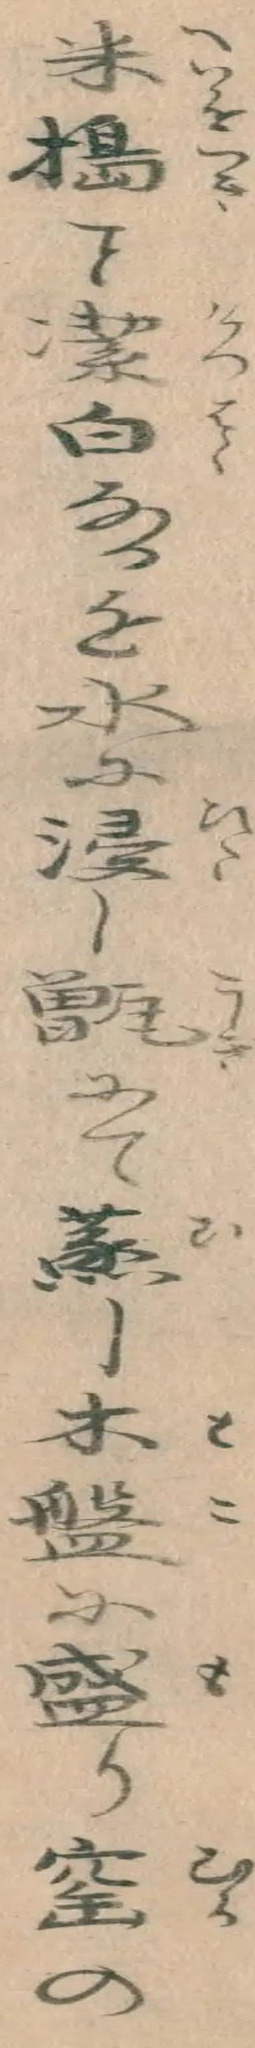米搗こと潔白なるを水に浸し甑にて蒸し木盤に盛り窯の
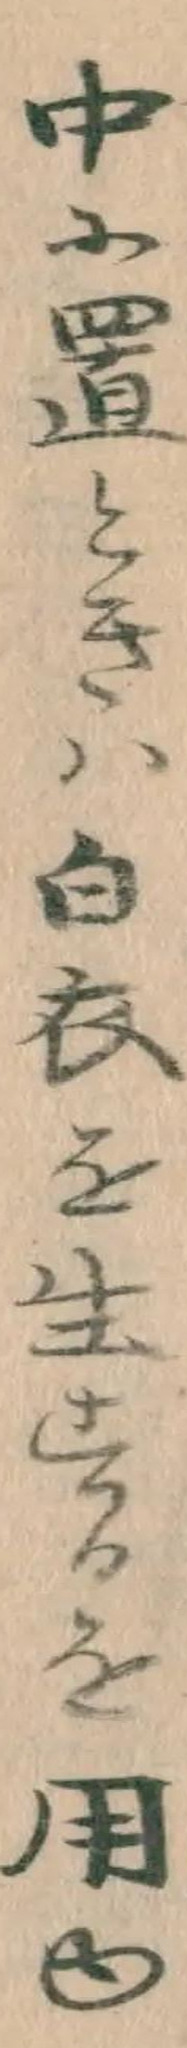中に置ときは白衣を生するを用ゆ
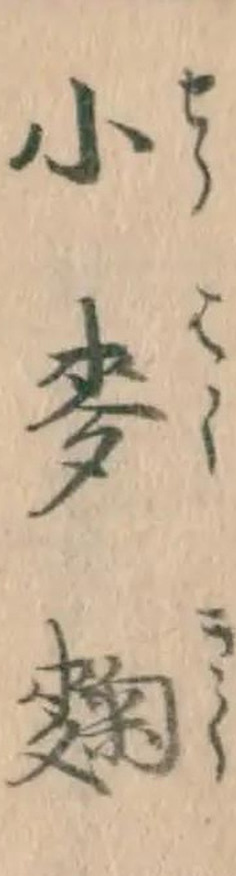小麦麹
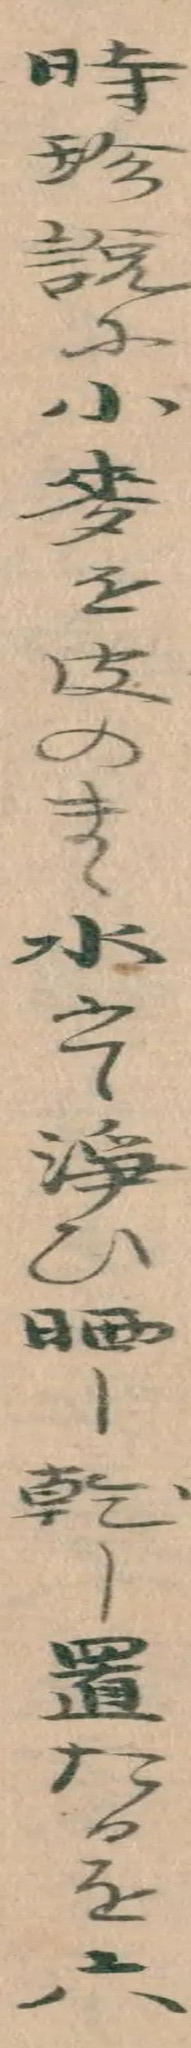時珍説に小麦を皮のまゝ水にて浄ひ晒し乾し置たるを六
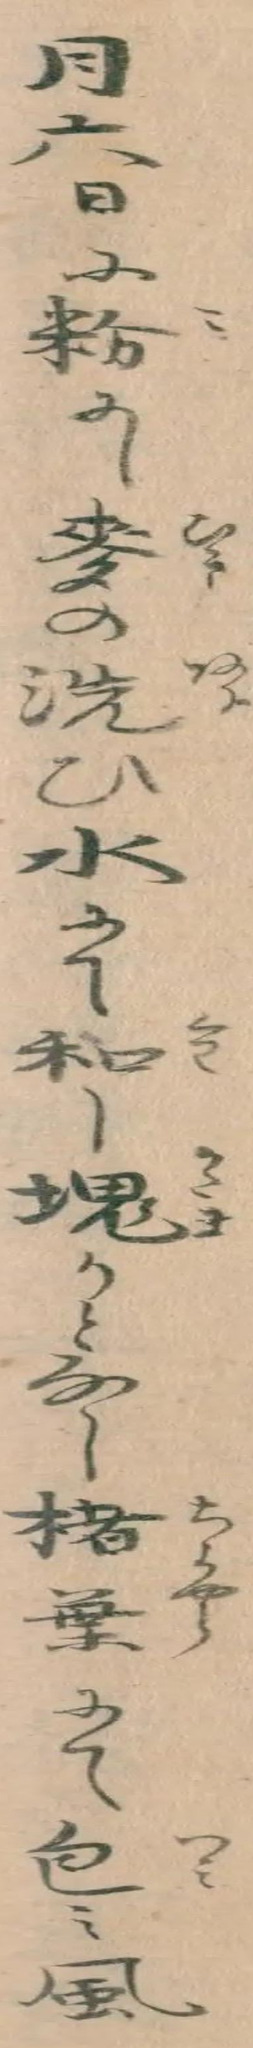月六日に粉にし麦の洗ひ水にて和し塊りとなし楮葉にて包み風
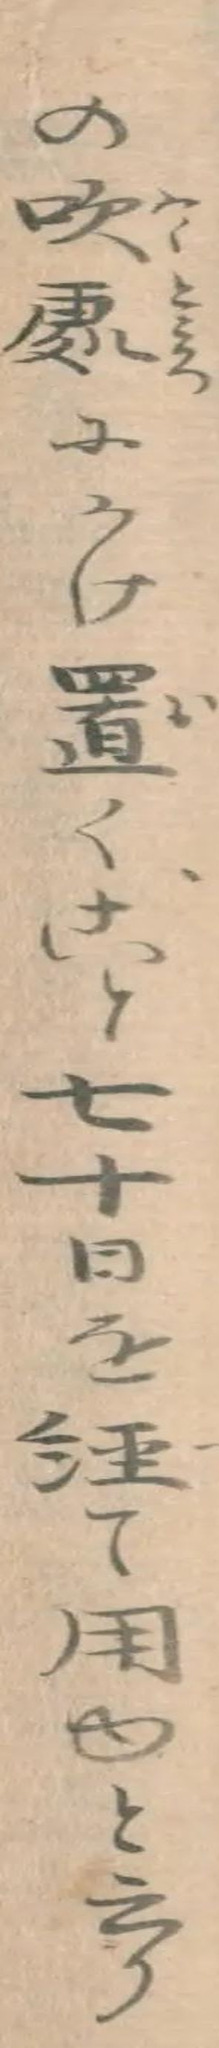の吹処にかけ置くこと七十日を経て用ゆと云り
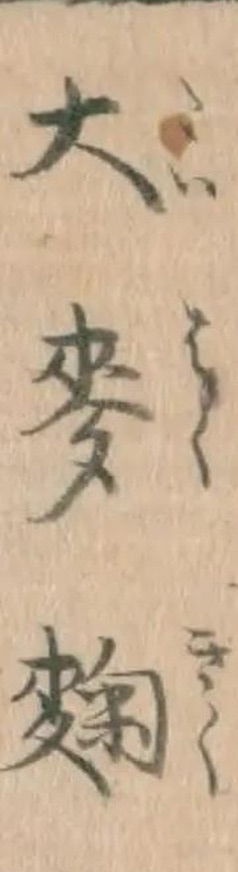大麦麹
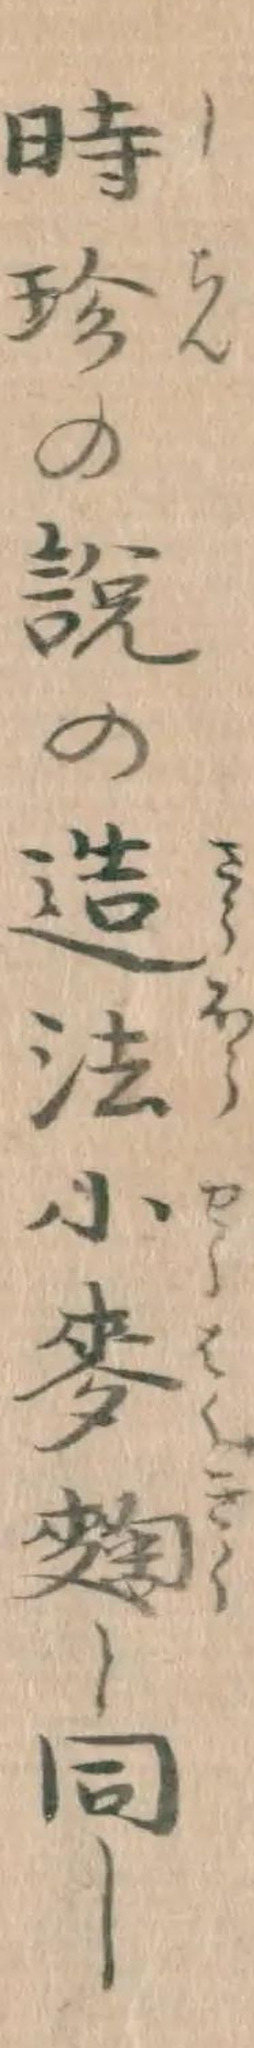時珍の説の造法小麦麹と同し
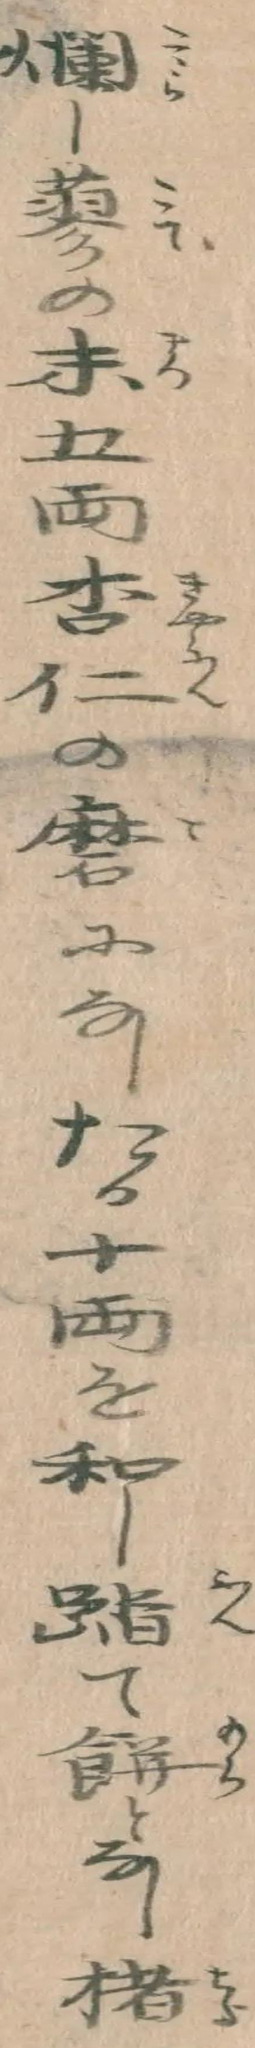爛し蓼の末五両杏仁の磨になしたる十両を和し踏て餅となし楮
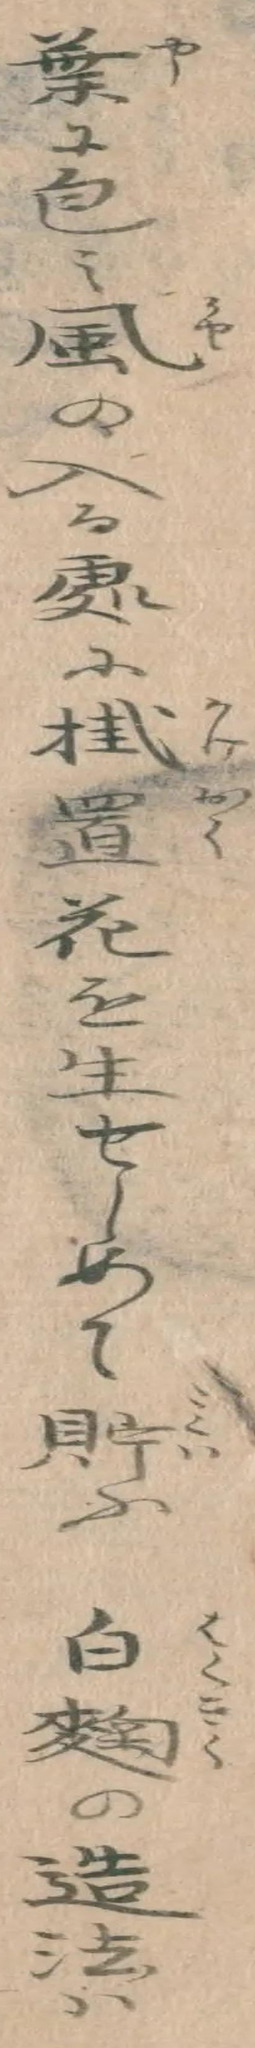葉に包み風の入る処に掛置花を生せしめて貯ふ白麹の造法は
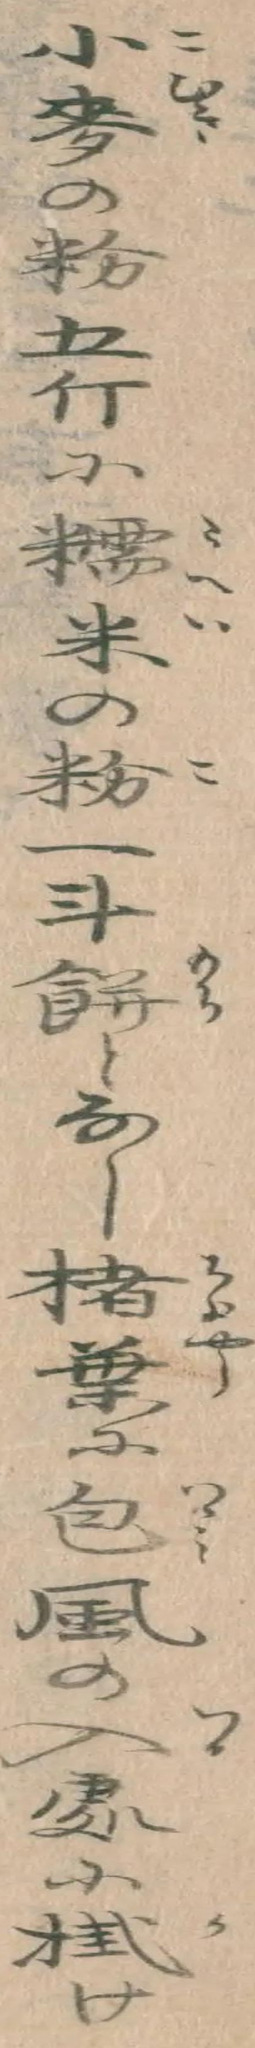小麦の粉五斤に糯米の粉一斗餅となし楮葉に包風の入処に掛け
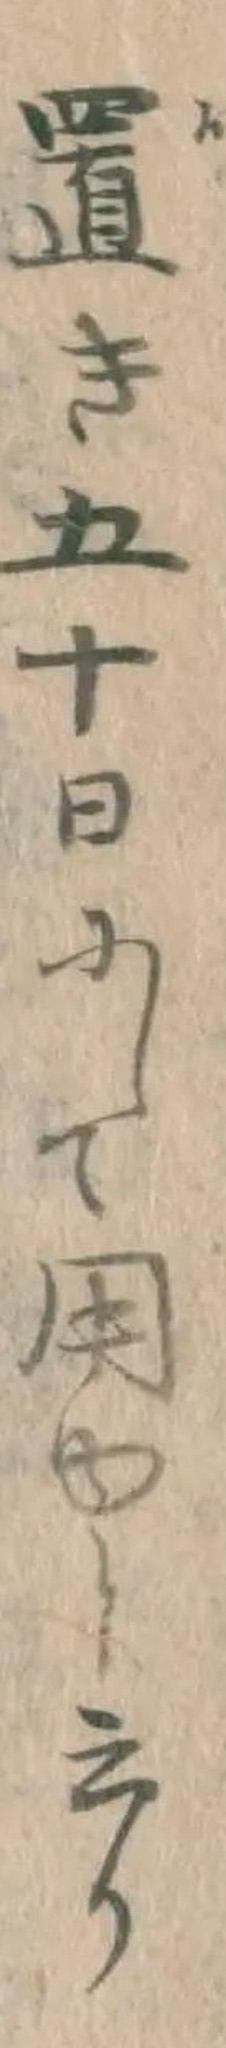置き五十日にして用ゆと云り

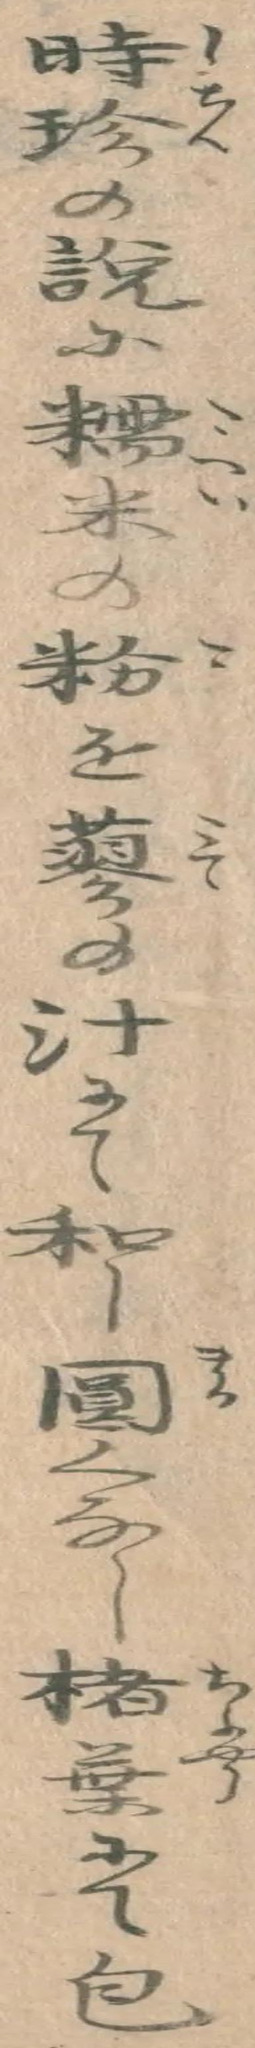時珍の説に糯米の粉を蓼の汁にて和し円くなし楮葉にて包
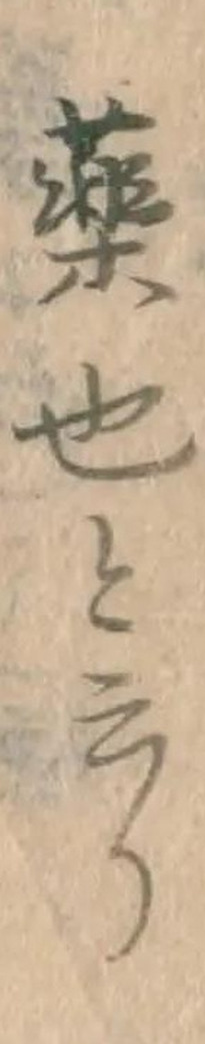薬也と云り
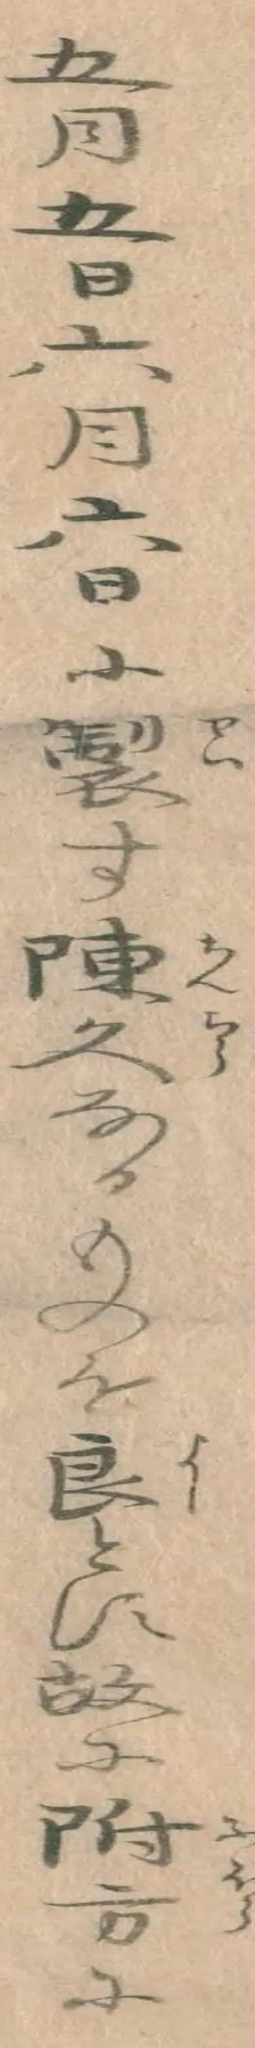五月五日六月六日に製す陳久なるものを良とす故に附方に
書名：本草図譜. 巻43-45
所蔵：国立国会図書館 National Diet Library, JAPAN
